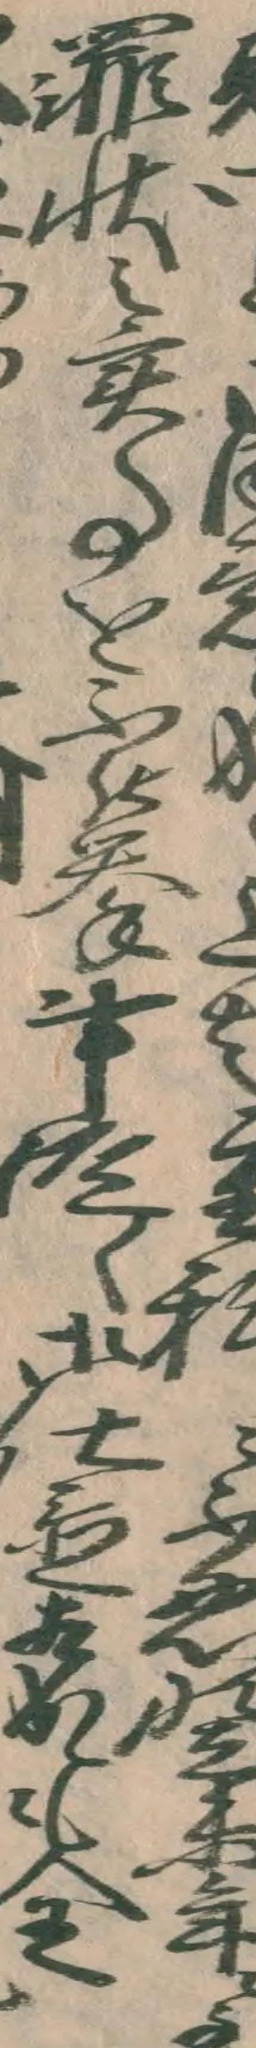罪状之実事を不被挙事軽く御仕置相成候も全
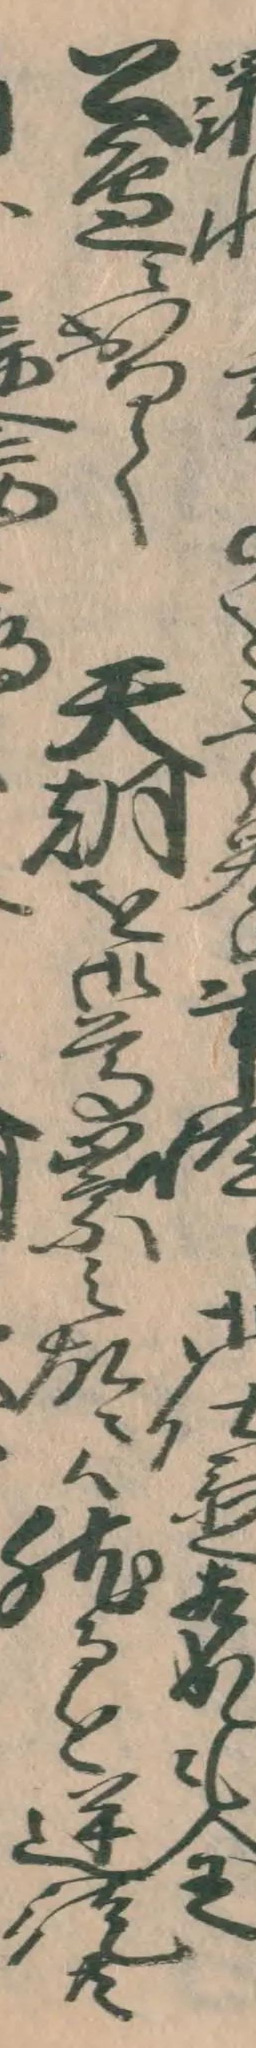公邊ニおゐて天朝を御尊崇之故ニ候然るを逆賊共
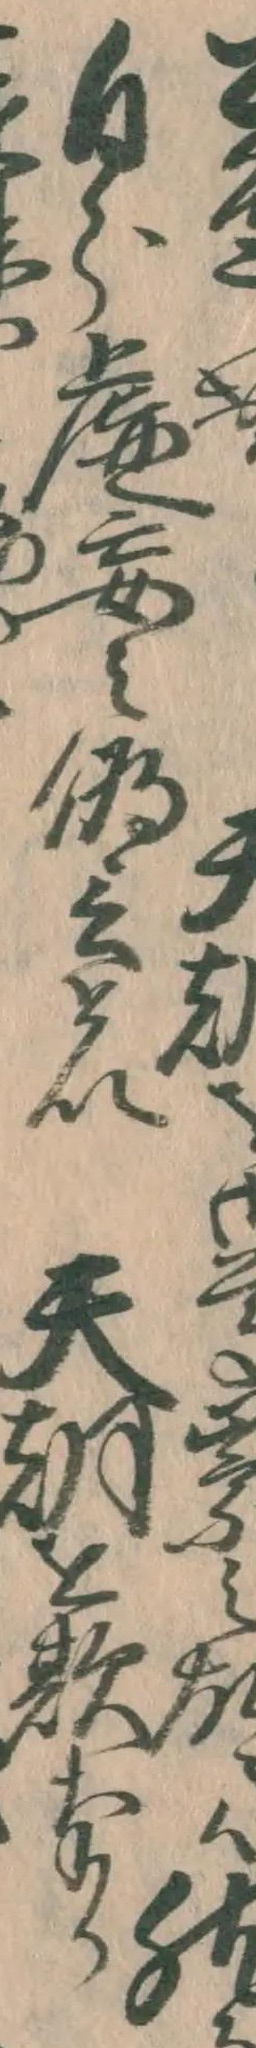自ら虚妄之偽言を以天朝を欺奉り
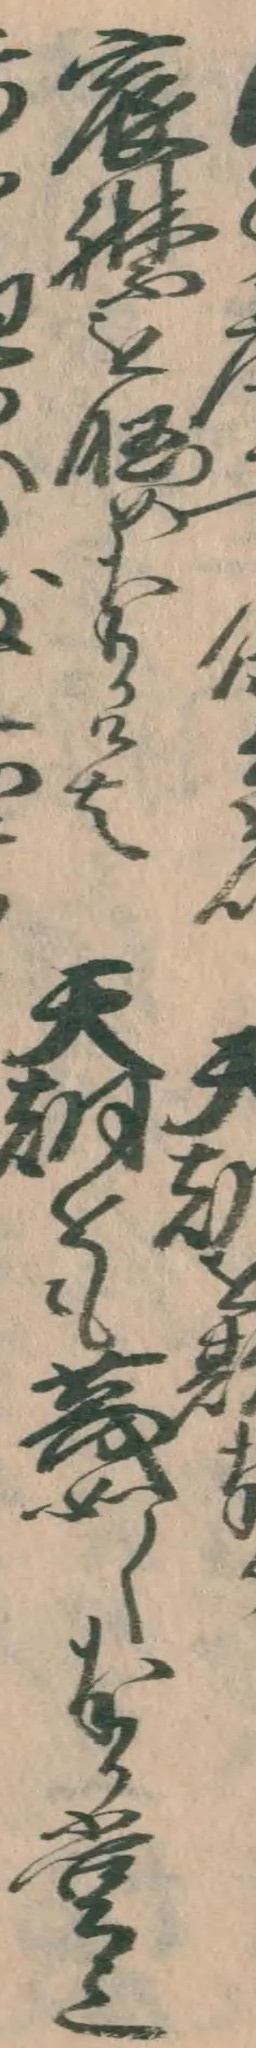宸襟を悩め奉り候者天朝をも蔑如し奉り堂上
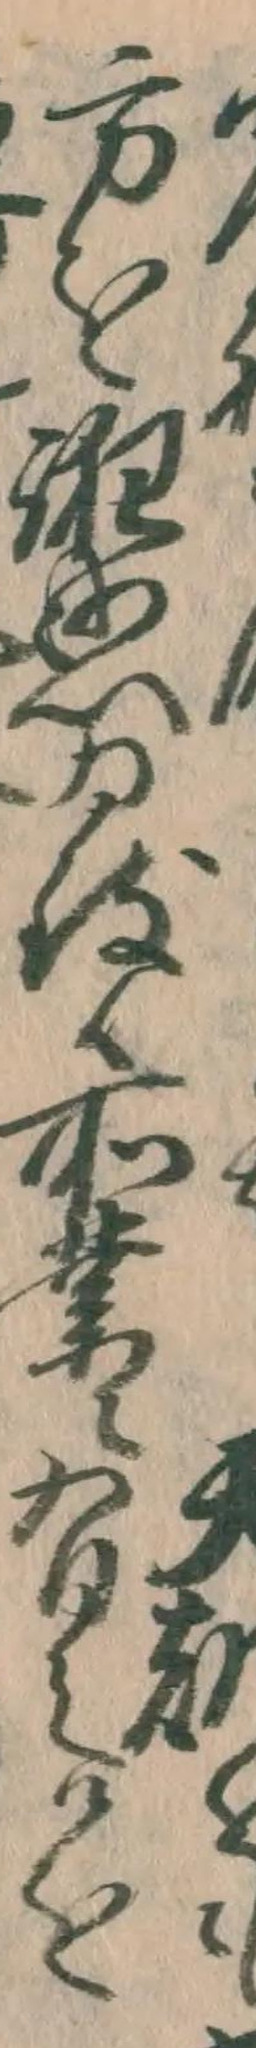方を誑惑被致候所業ニ有之候を
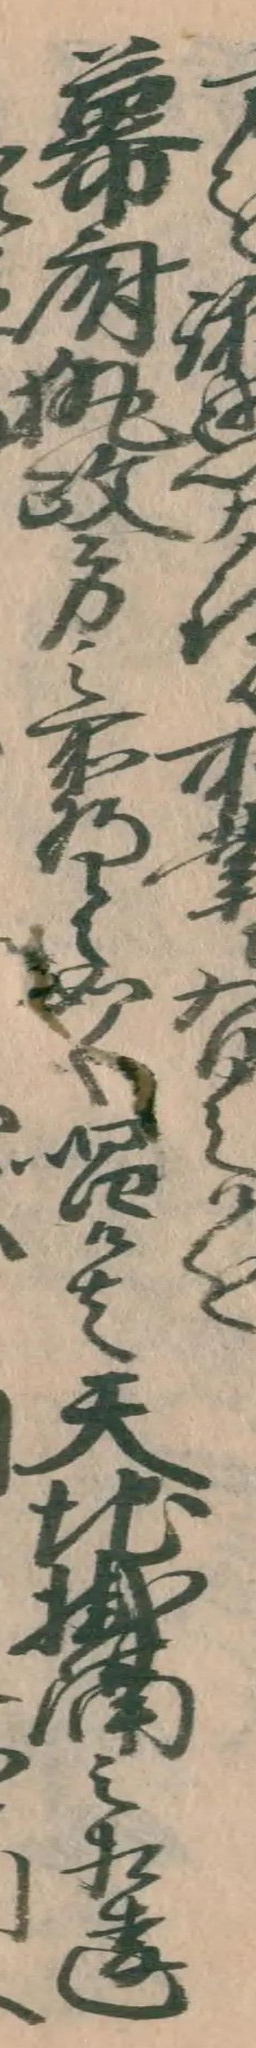幕府執政方之所持之如く唱候者天地掛隔之相違
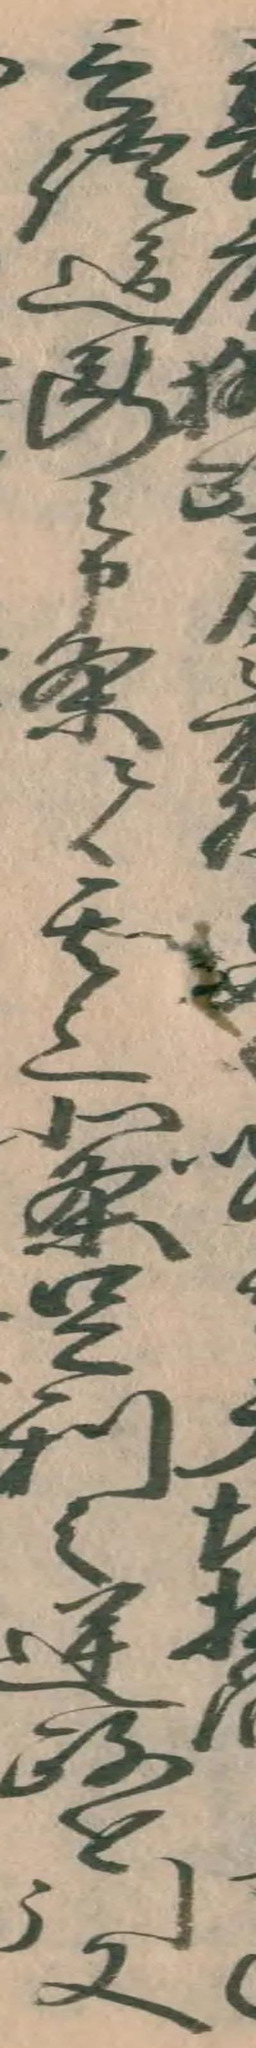言語道断之申条ニ候其上北条足利之逆政を引又
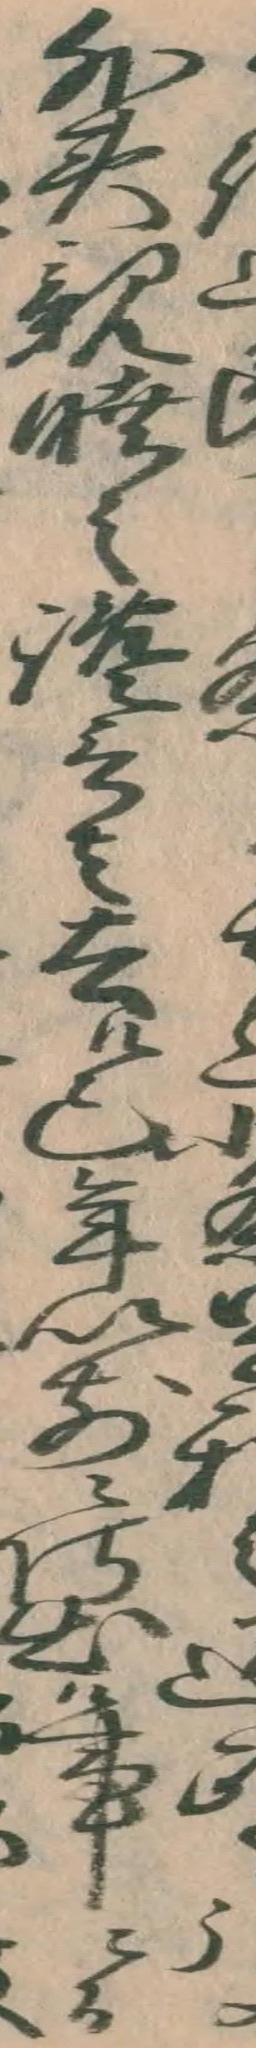外夷親睦之讒言者去ル巳年以前ニ打出候事ニ而
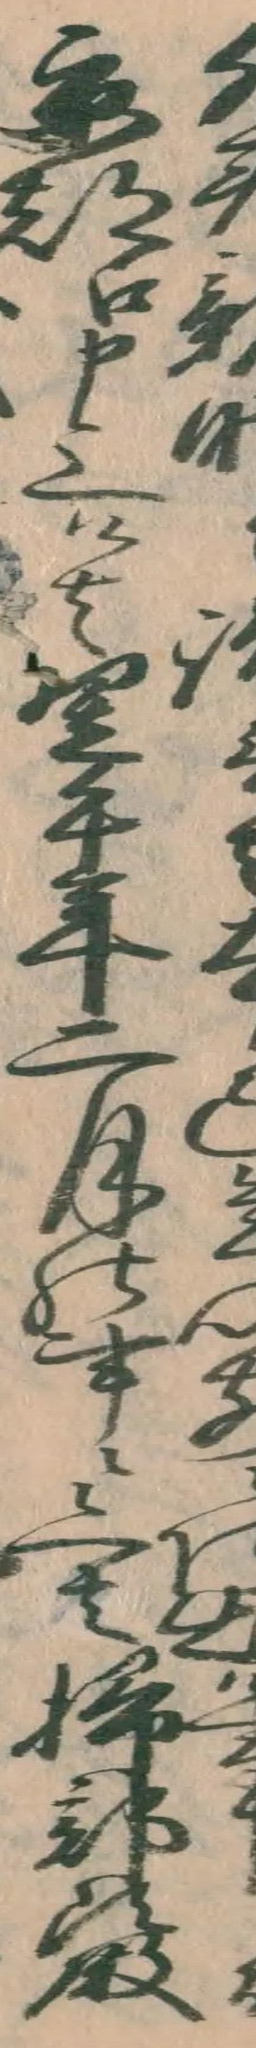京都江申上候者翌午年二月の事ニ候へ者掃部頭殿
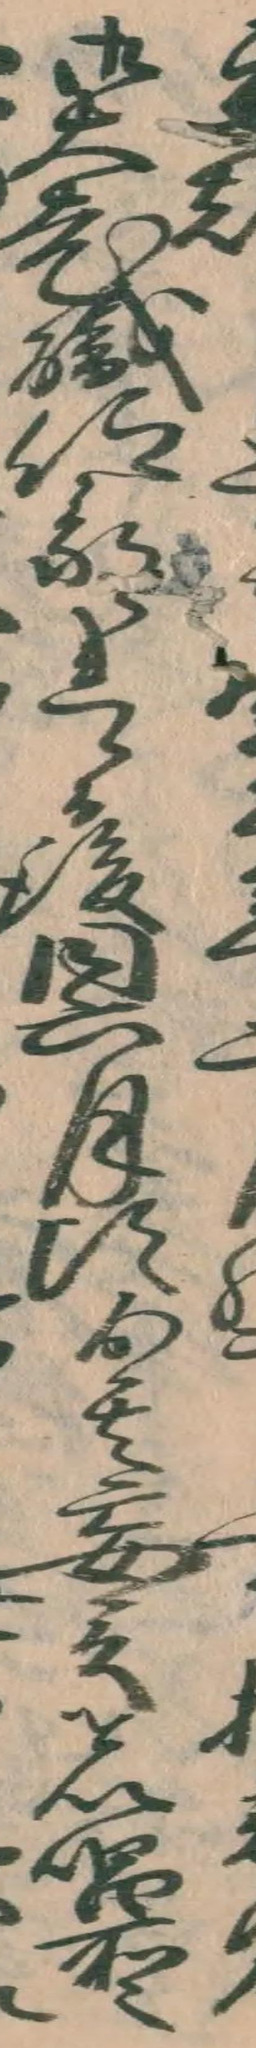御大老職仰蒙られ候而後同六月頃ゟ其妄言を以唱所々
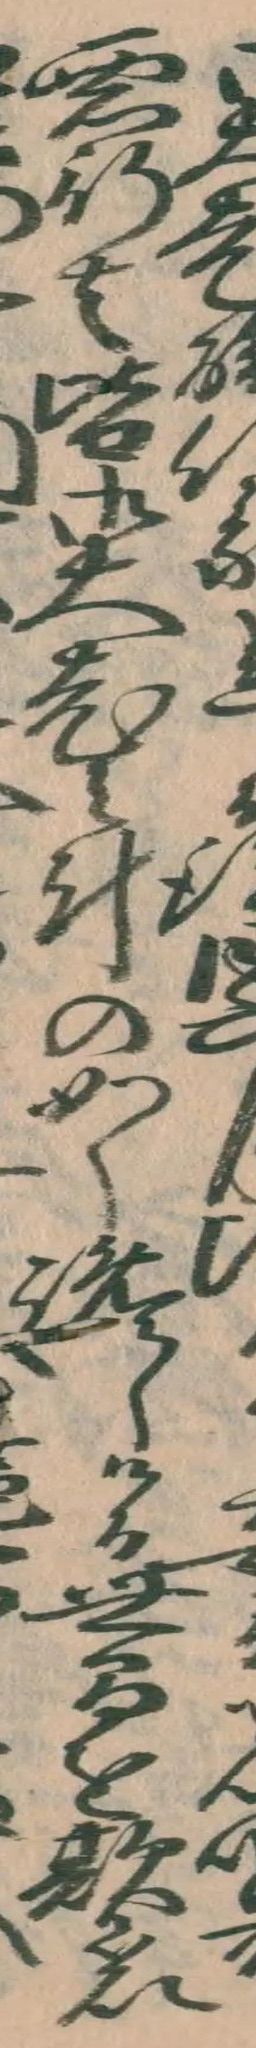悪行者皆御大老之斗の如く讒し候而世間を欺候を以
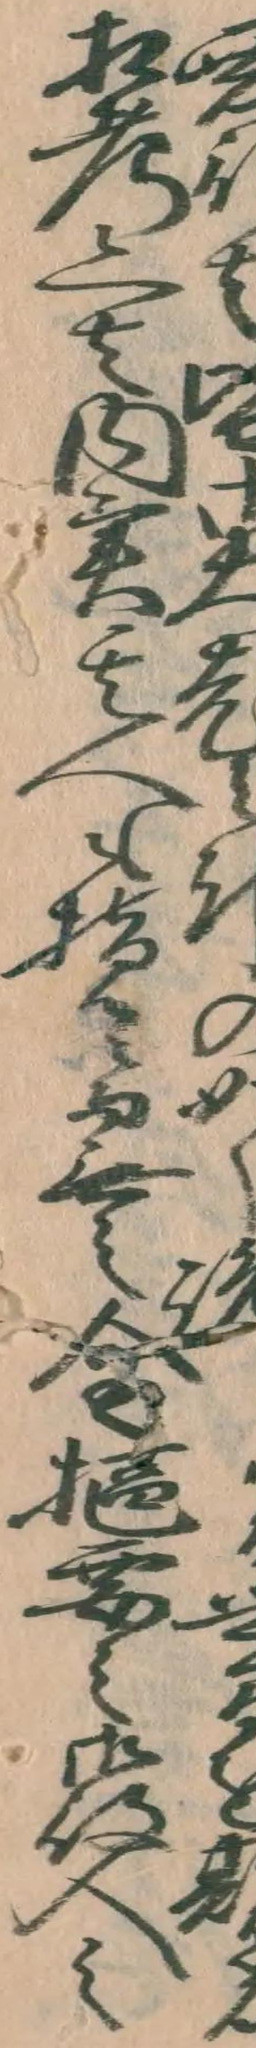相考候へ者内実其人も指んニ而無之全樞要之御役人之
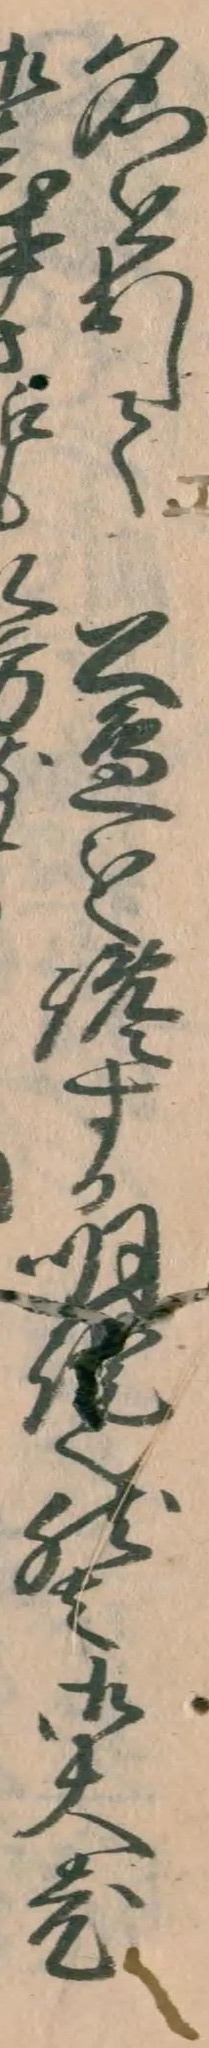名を出して公邊を讒する明證也然者御大老
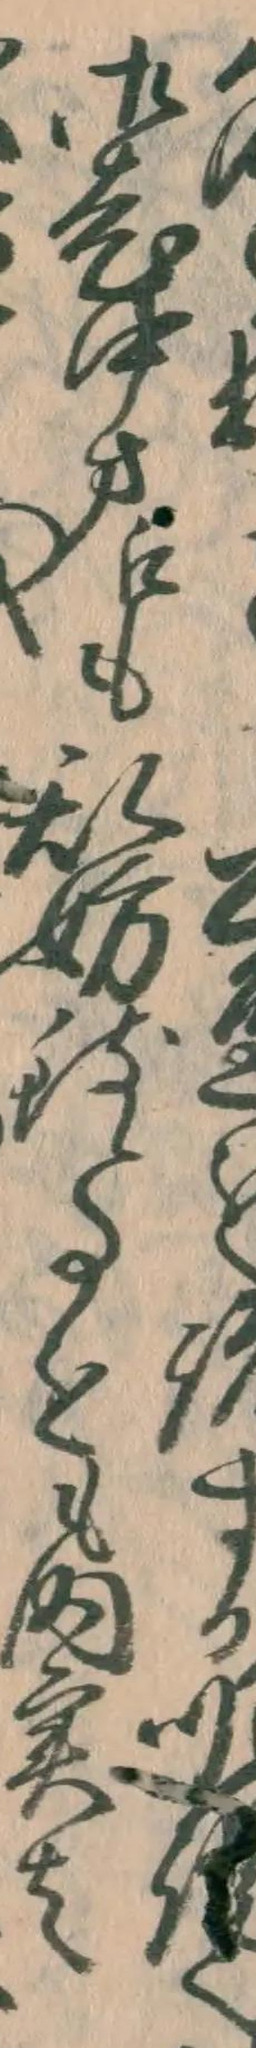御老中方江も乱妨致候事をも内実者
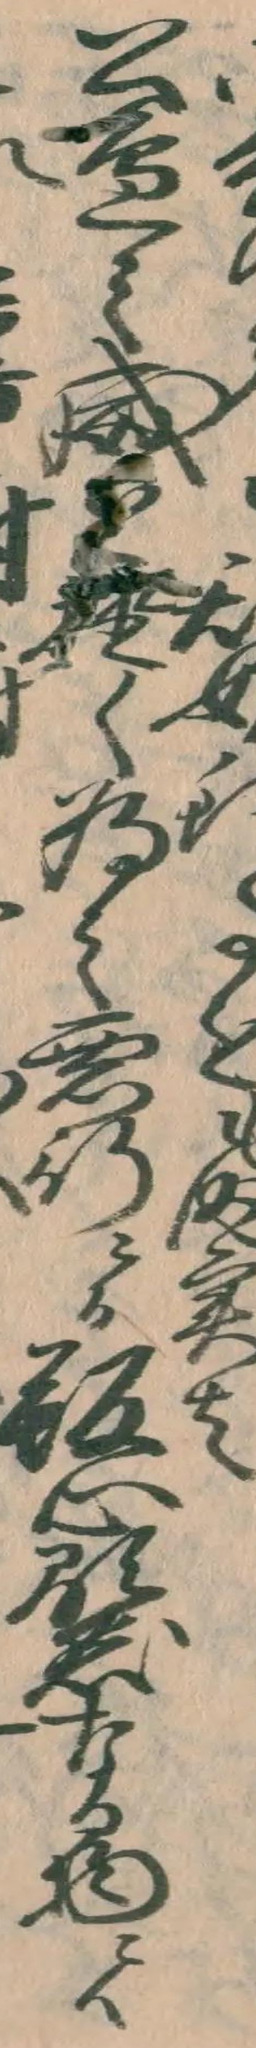公邊之威を挫く為之悪行ニ而叛心顕然なる物ニ候
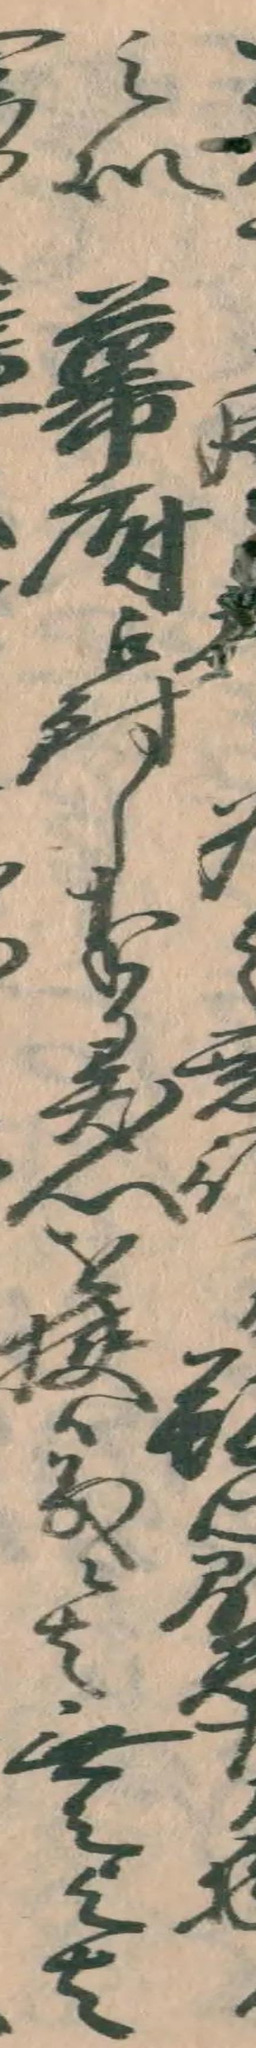之処幕府江對し奉り異心を挟候義ニ者無之と者
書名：麗斎叢書. 20
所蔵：国立国会図書館 National Diet Library, JAPAN
